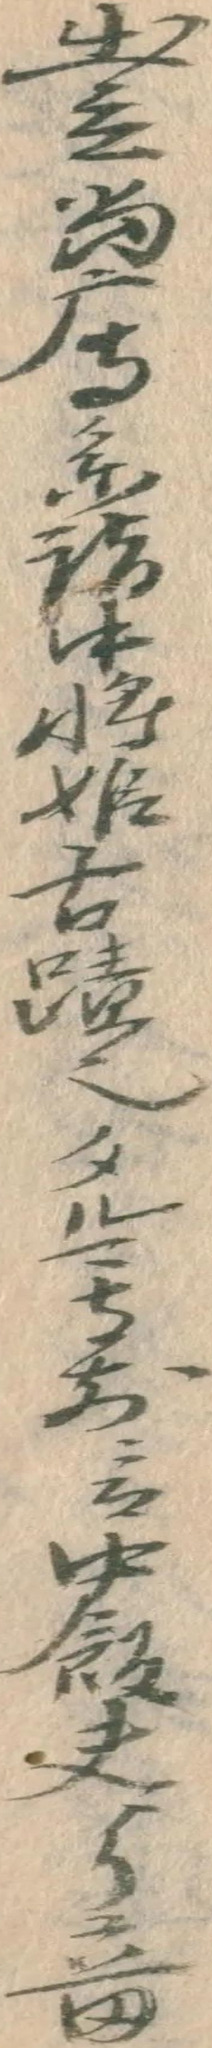出立當摩寺参詣中将姫古蹟也タルマ寺前ニ而中飯夫より立田
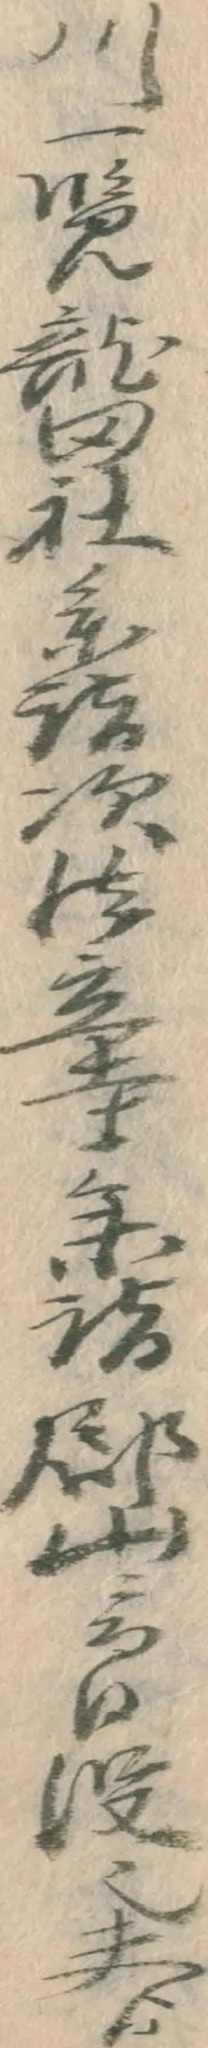川一覧龍田社参詣次法立寺参詣郡山ニ而日没也夫ゟ
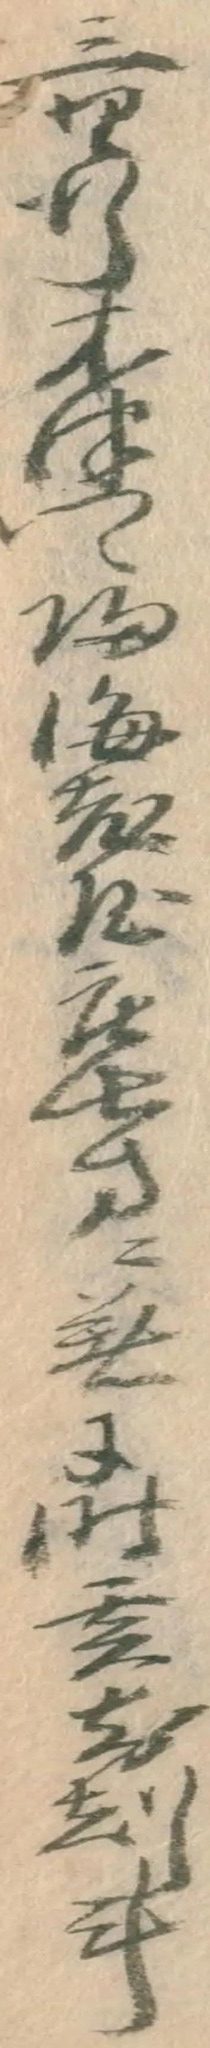三里行木津門ヘ帰海彦屋庄七方二着于時亥前刻斗

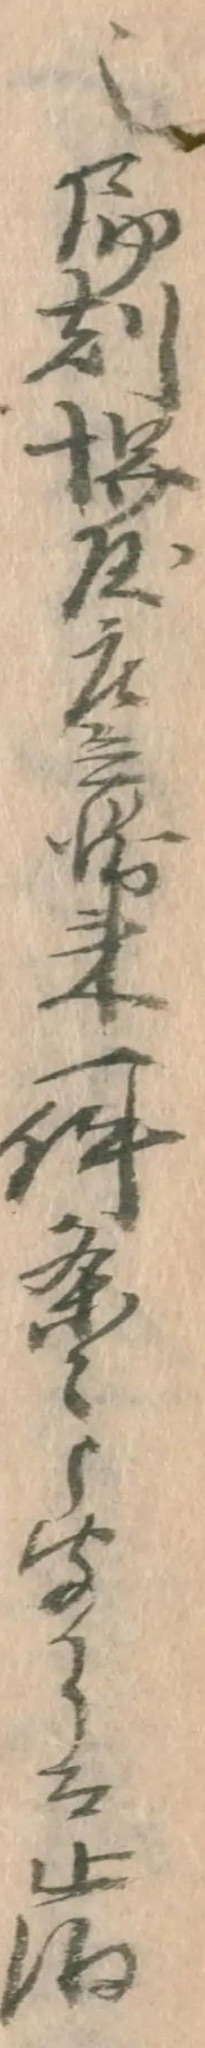也即刻堺屋庄兵衛来一件条々申聞了而止泊
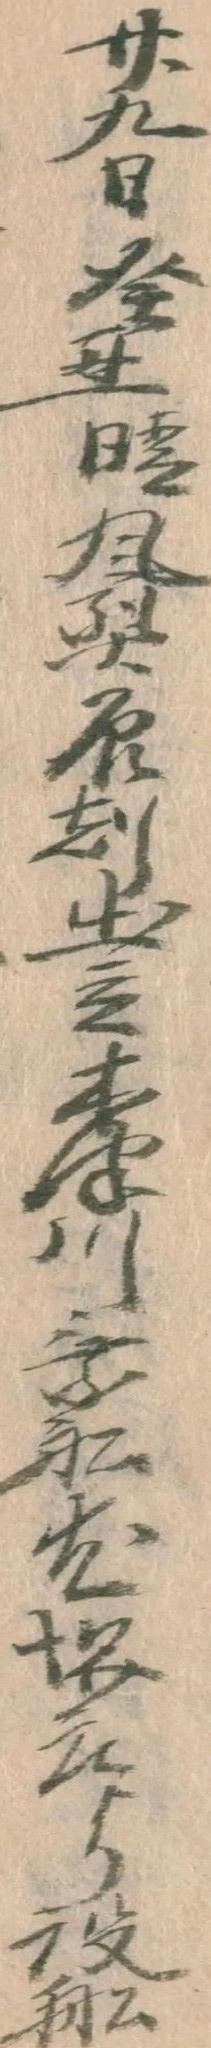廿九日癸丑晴風烈辰刻出立木津川乗舩尤堺庄より設舩
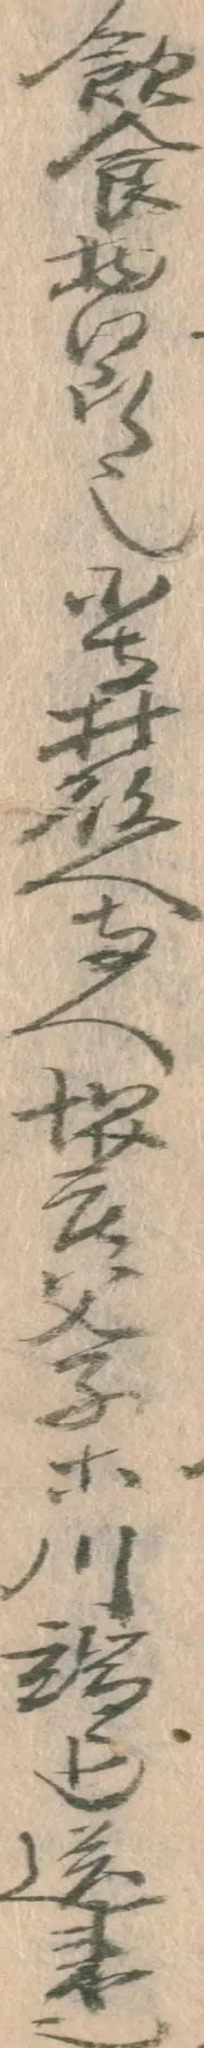飲食物同断也北寺村役人両人堺庄父子等川端迄送来也
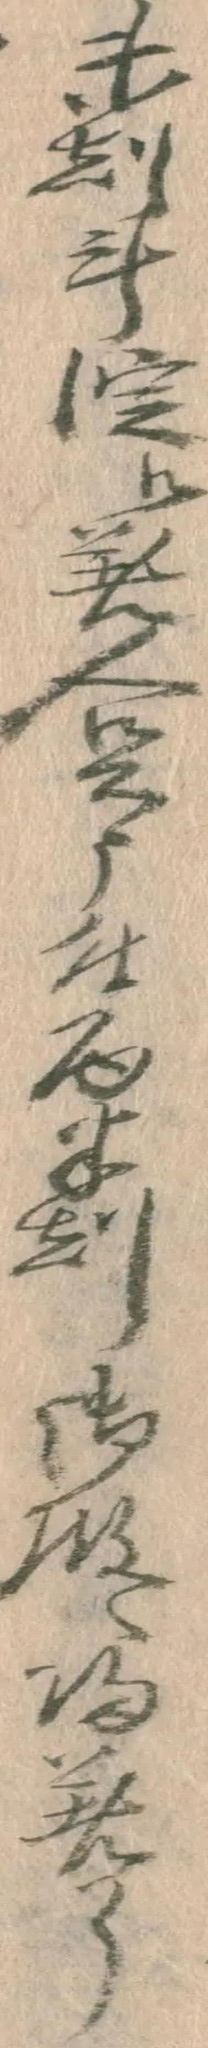未刻斗淀え着人足申付酉半刻御殿へ帰着了
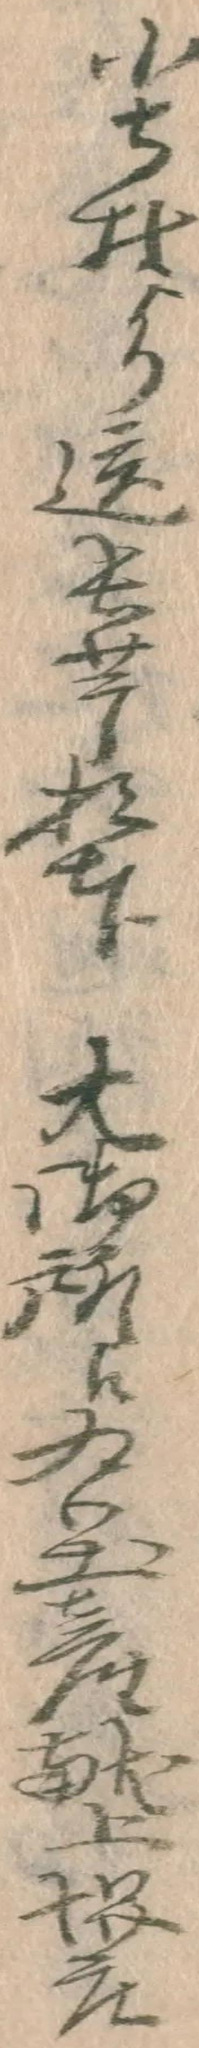小寺村より送長芋拾本大御所江為御土産献上堺庄
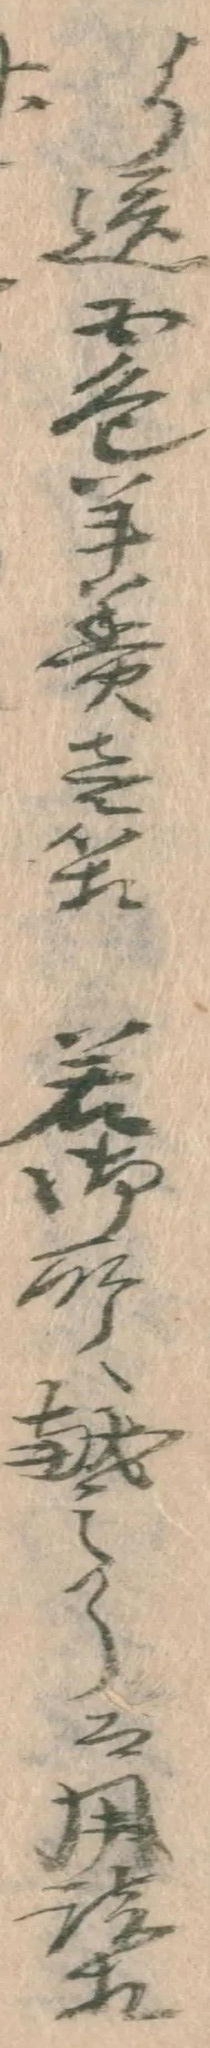より送五色羊羹壱箱若御所へ献之了而用読相
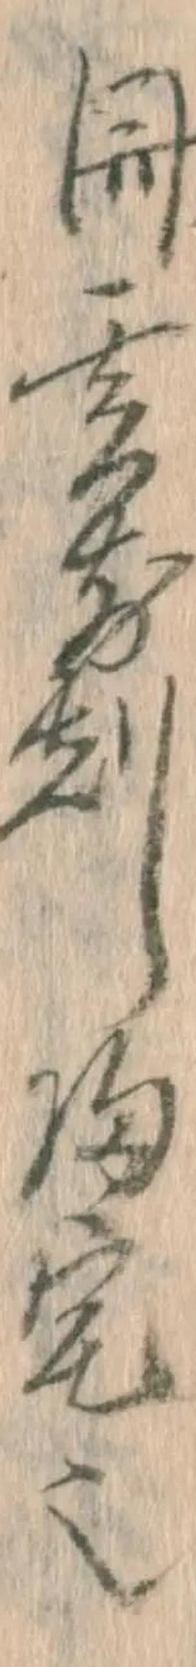済玄前刻帰宅也
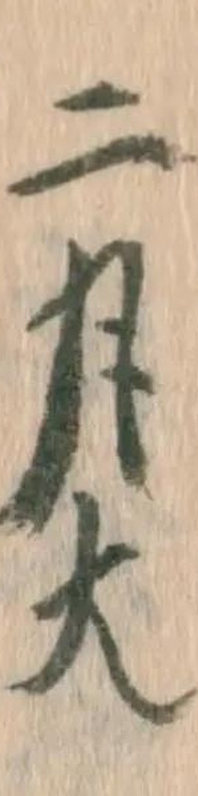二月大
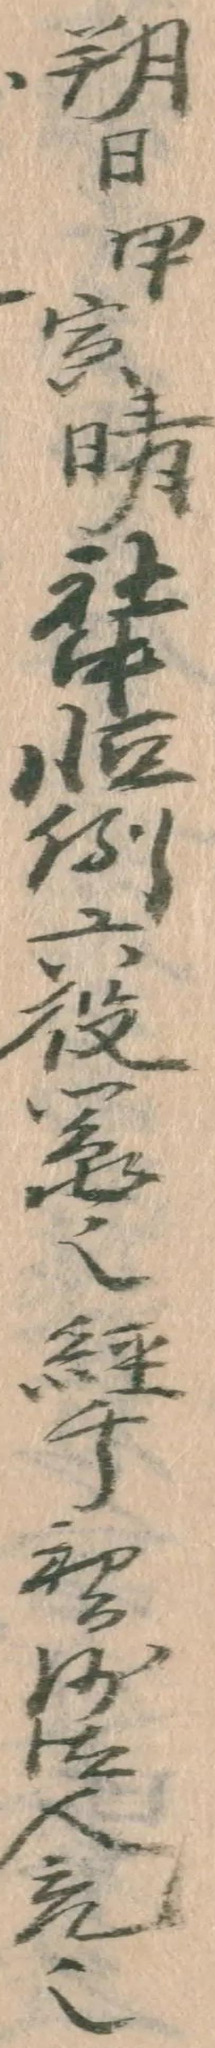朔日甲寅晴社中恒例六役鬮也経千初而沙汰人充也
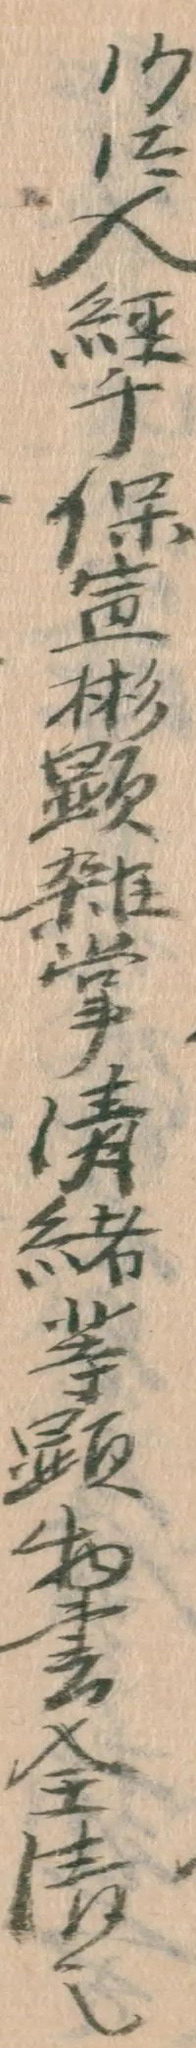沙汰人経千保宣彬顕雑掌清緒等顕物書全清也
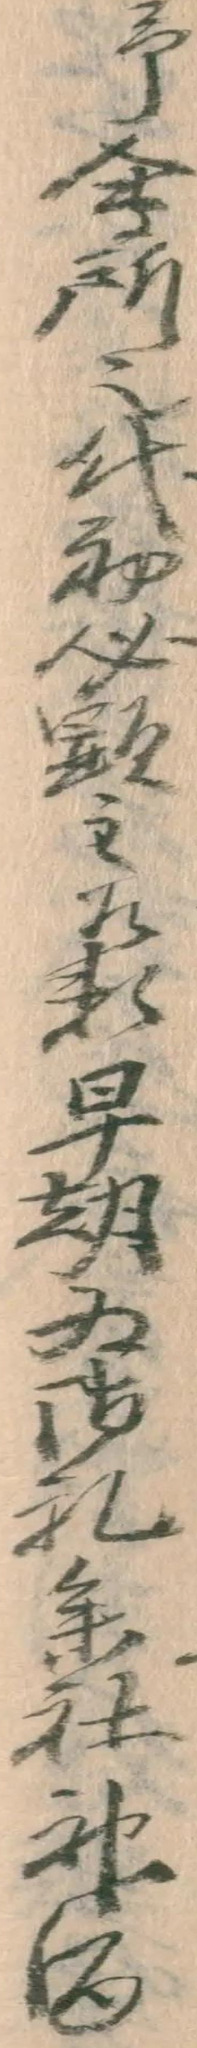予會所之代勤必顕之相頼早朝為御礼参社神酒
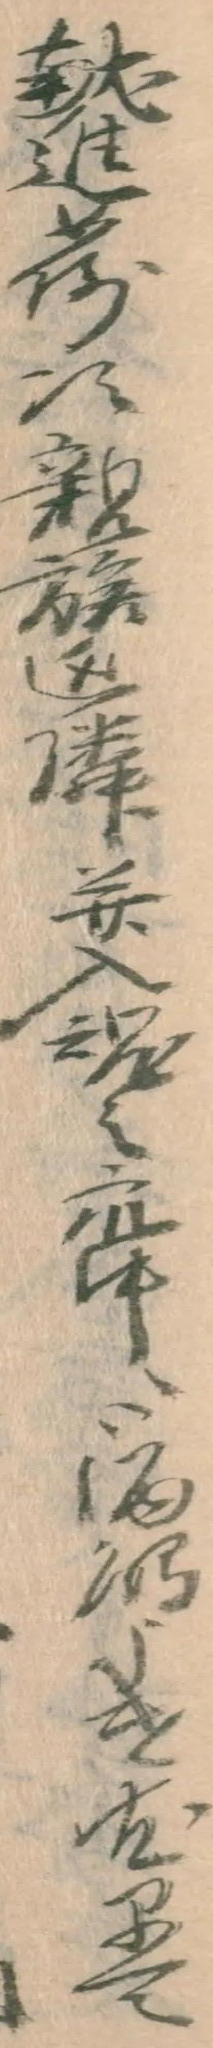献進如例次親族近隣并入魂之衆中へ御酒觸申遣尤早
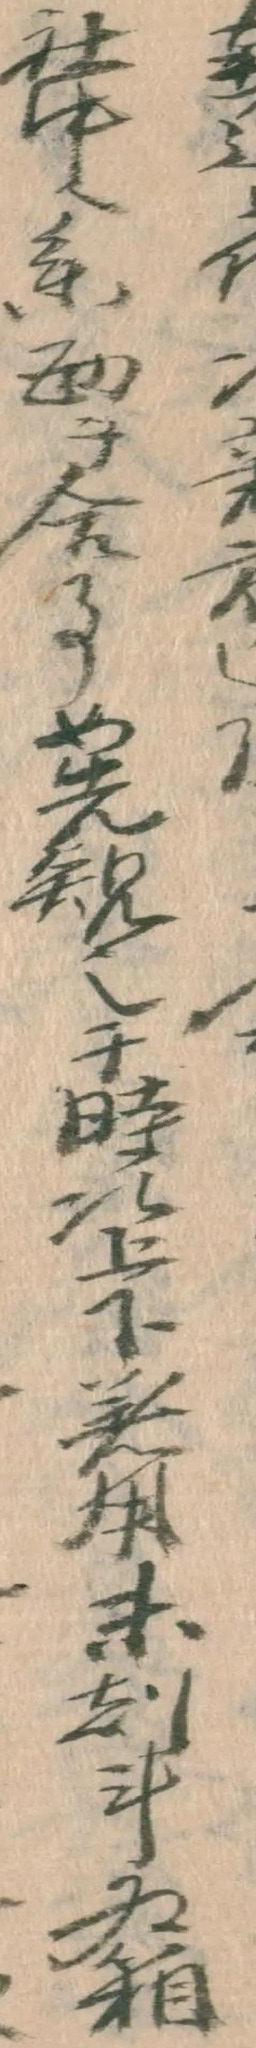社中へ参面ヲ合事如先規也于時次上下着用未刻斗為箱
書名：賀茂社記録. 第67冊
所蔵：国立国会図書館 National Diet Library, JAPAN
